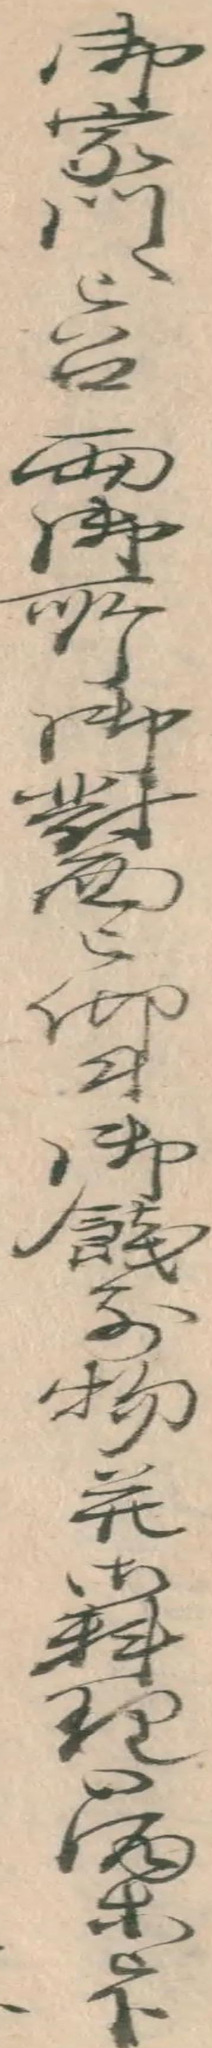御家門へ被召両御所御對面被仰付御餞別物并御料理御酒等被下
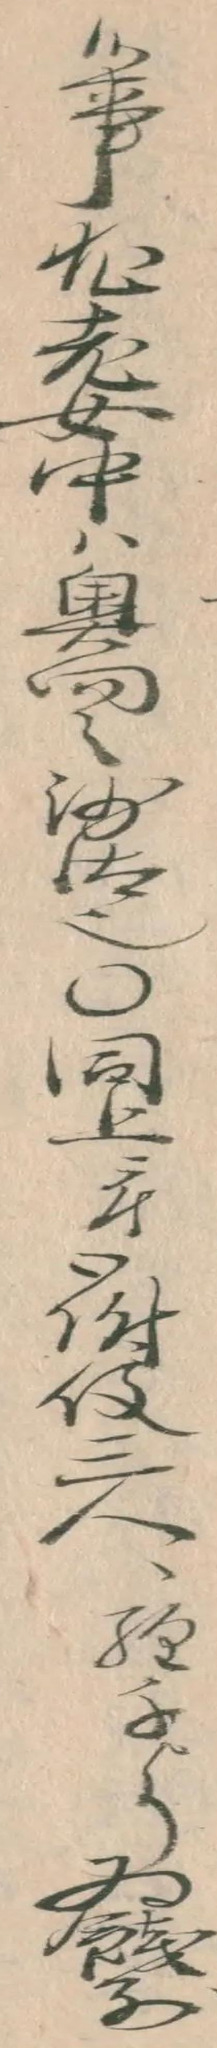候事尤老女中ハ奥向之沙汰也○同上ニ付御附役三人経千より為餞別
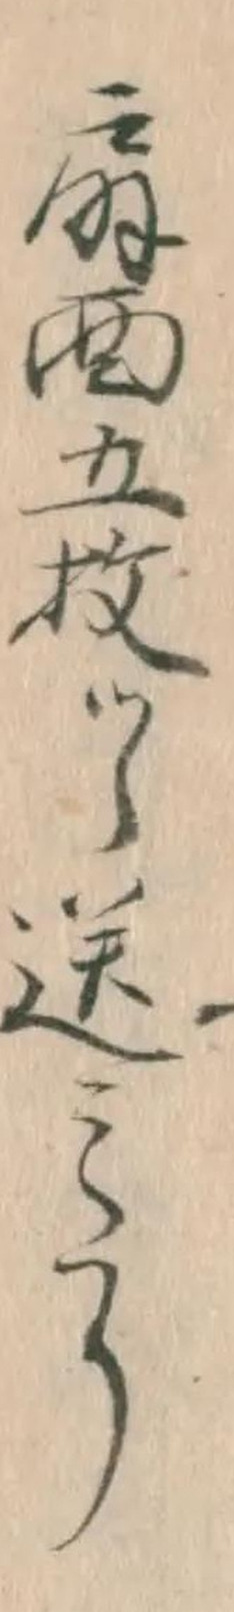扇面五枚ツヽ送之了
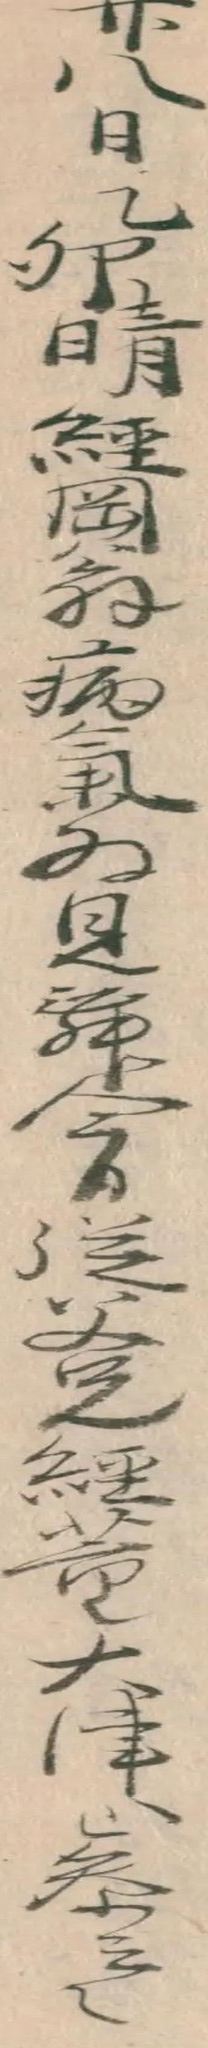廿八日乙卯晴経岡翁病氣為見舞今日従父兄経董大津へ被参云々
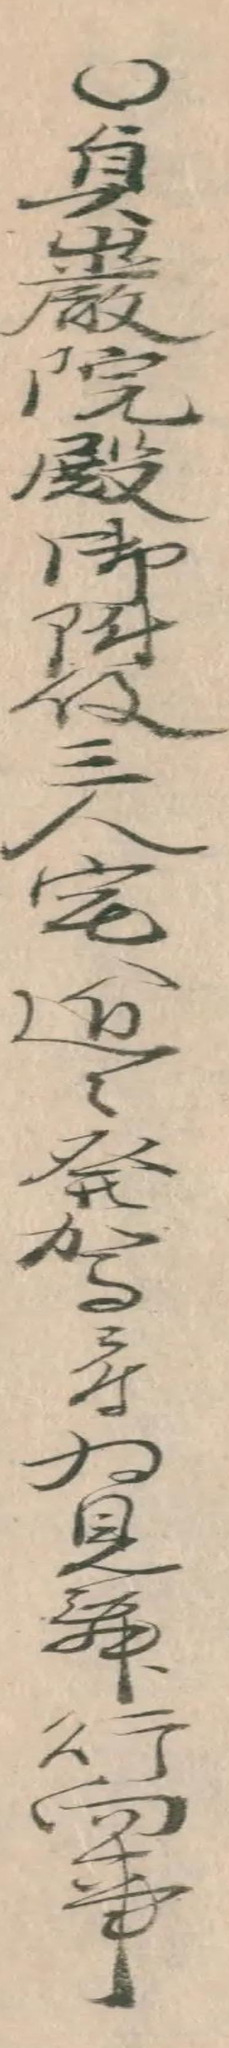○貞巌院殿御附役三人宅へ近〻発駕ニ付為見舞行向事
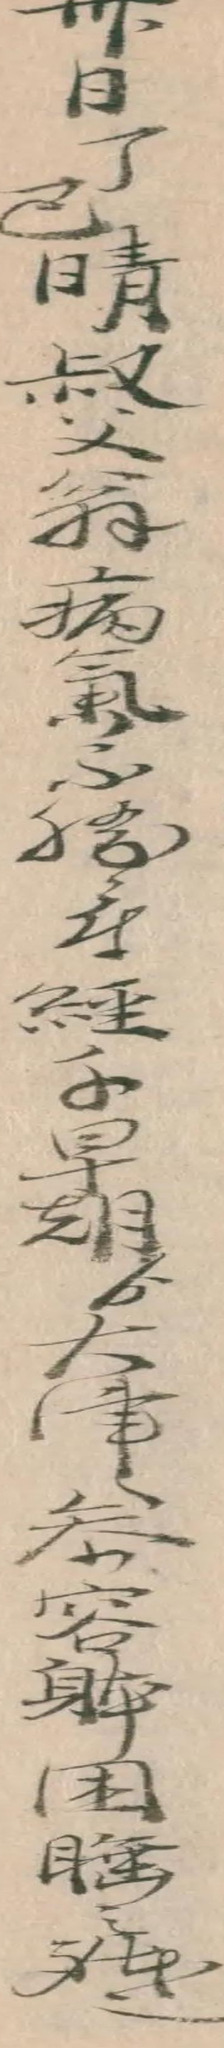廿日丁巳晴叔父翁病気不残ニ付経千早朝ゟ大津へ参容躰困睡之躰也
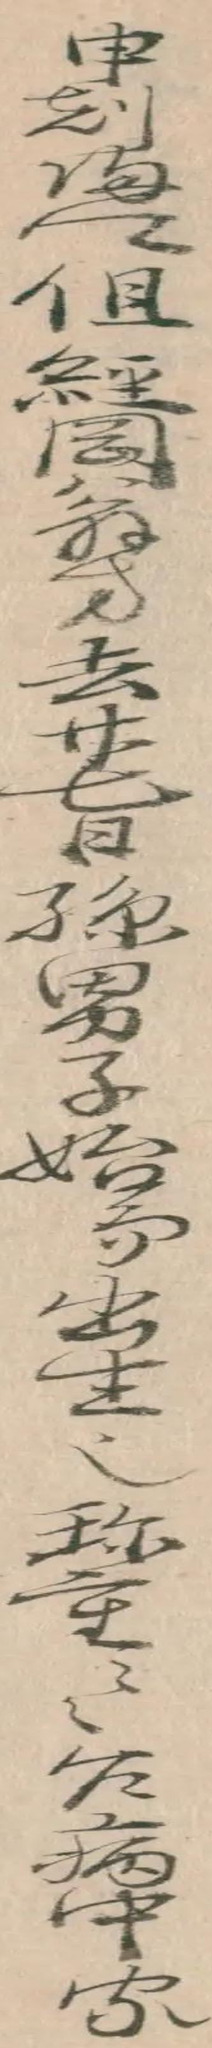申刻帰郷但經岡翁方去廿七日孫男子始而出生也称重〻乍病中家
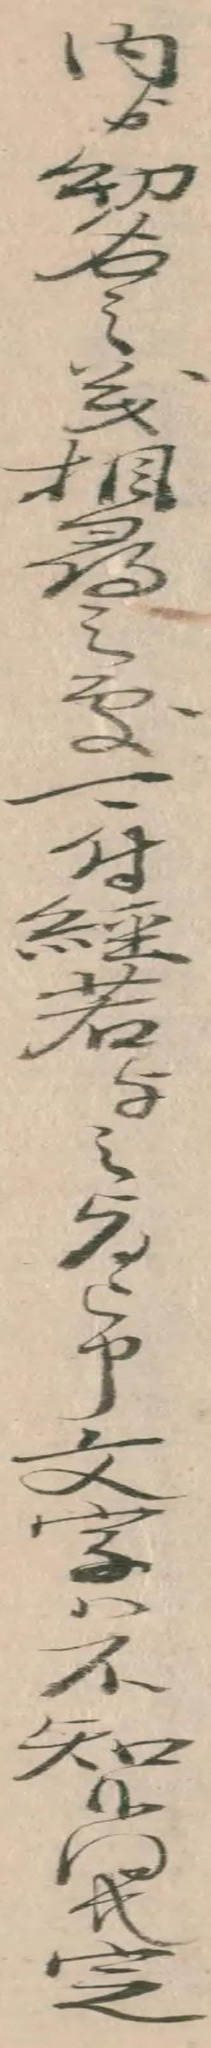内ゟ幼名之義相尋之處可付経若と之旨被申文字ハ不知候得共定
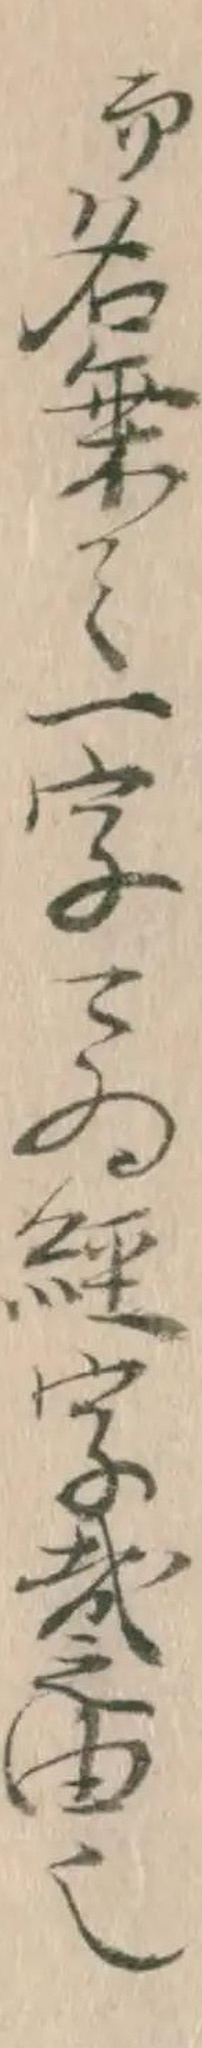而名乗之一字被為経字哉之由也
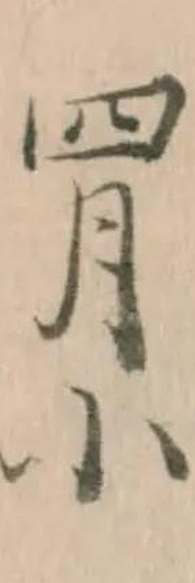四月小
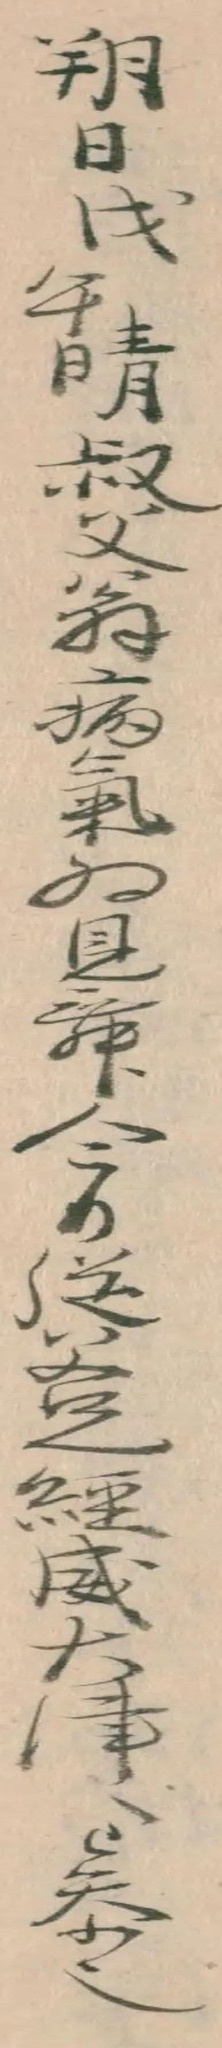朔日戊午晴叔父翁病氣為見舞今日従父兄経威大津へ被参也
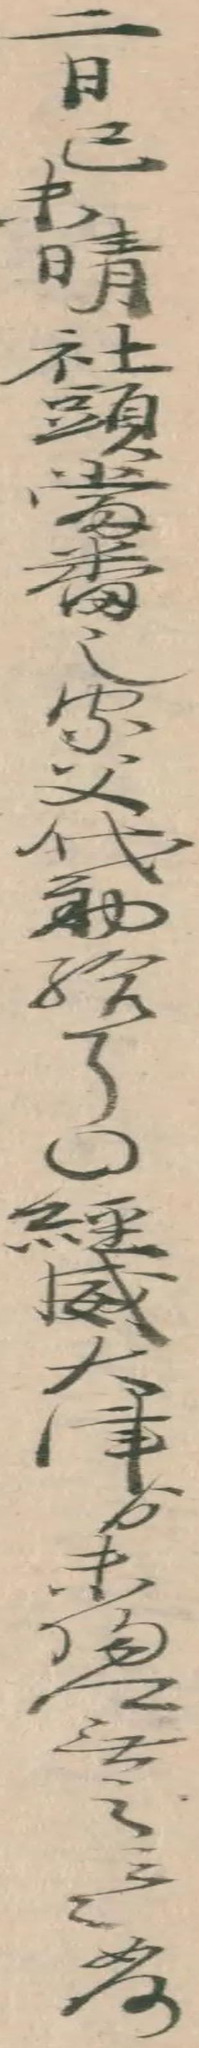二日巳未晴社頭當番之家父代勤給了○経威大津ゟ未帰郷無之云々如何
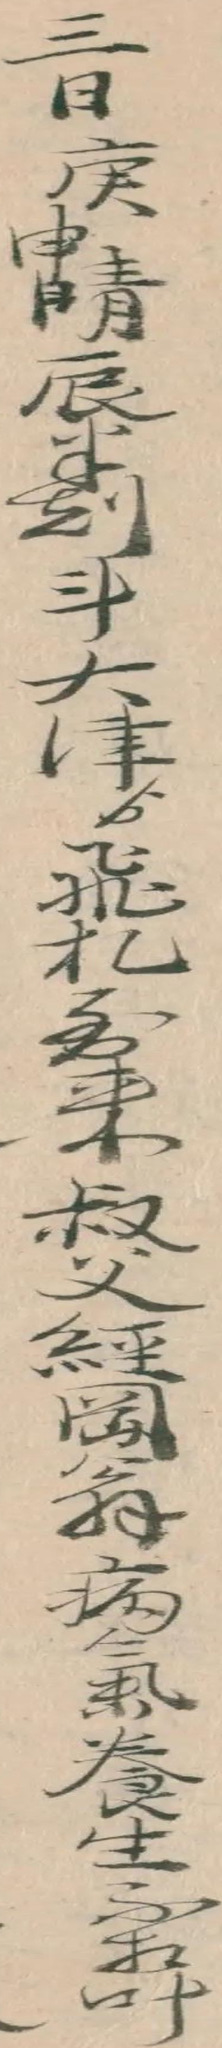三日庚申晴辰半刻斗大津ゟ飛札到来叔父経岡翁病氣養生不相叶
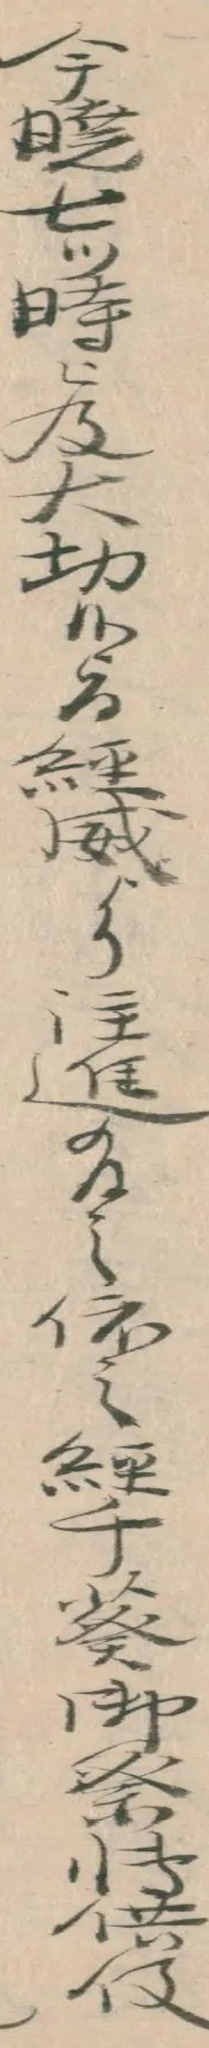今暁七ツ時被及大功候旨経威より注進有之依之経千葵御祭轉供役
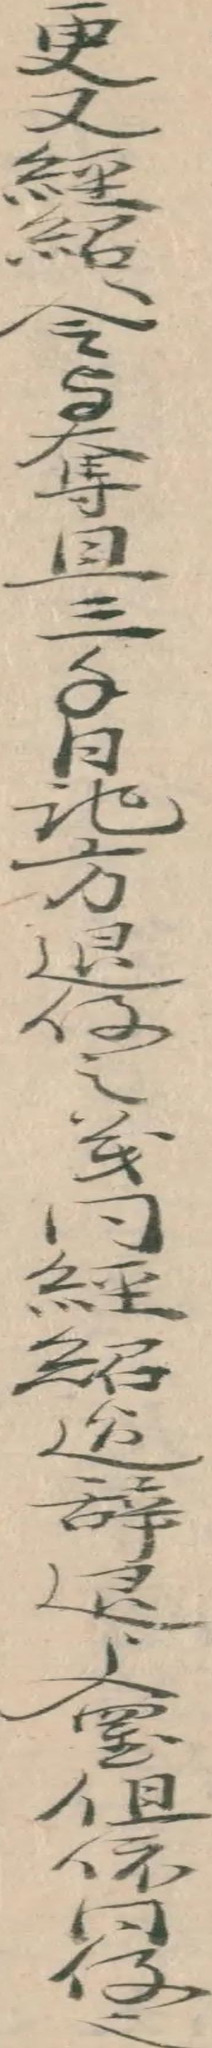更又経紹へ今与奪且三手日記方退役之義同経紹迄辞退申入置但依同役也
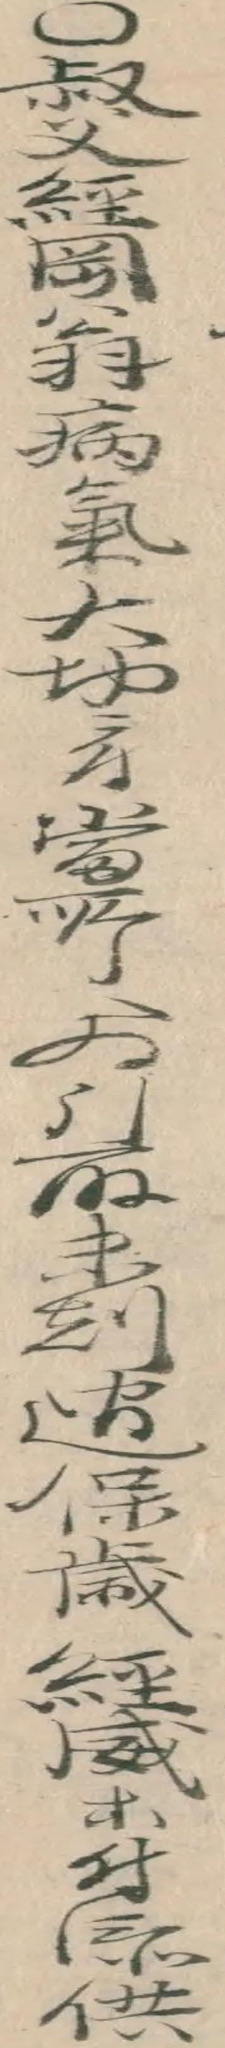◯叔父経岡翁病氣大功ニ付當所へ為引取未刻過保歳経威等付添供
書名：賀茂社記録. 第65冊
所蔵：国立国会図書館 National Diet Library, JAPAN
